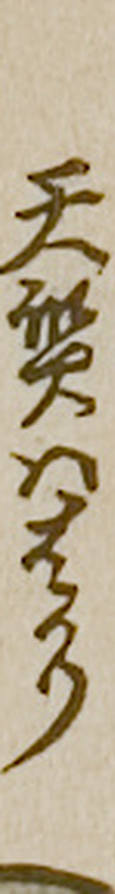天質ははかり
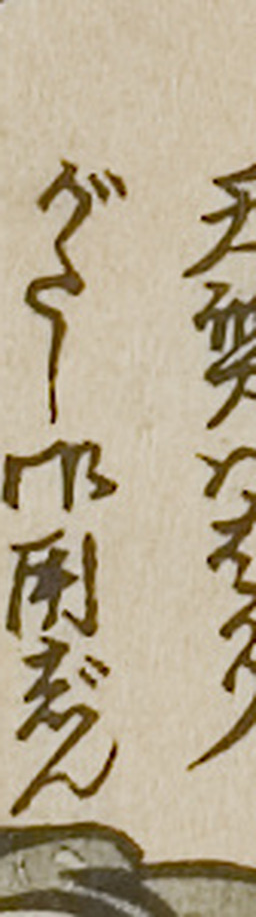がたし御用じん
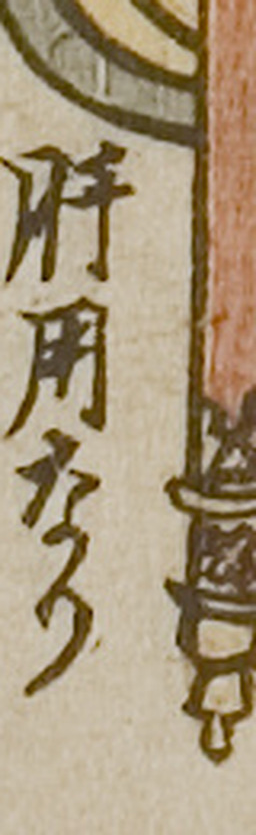肝要なり
